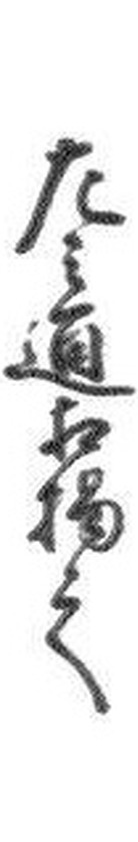左之通相掲之

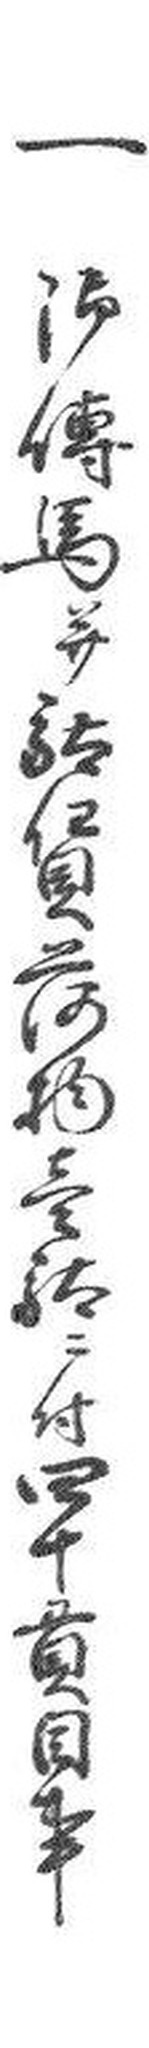一御傳馬并駄賃荷物壱駄ニ付四十貫目事
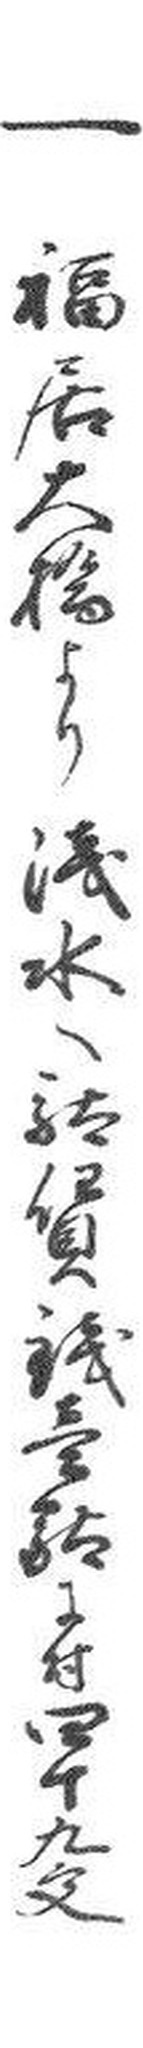一福居大橋より浅水へ駄賃銭壱駄に付四十九文
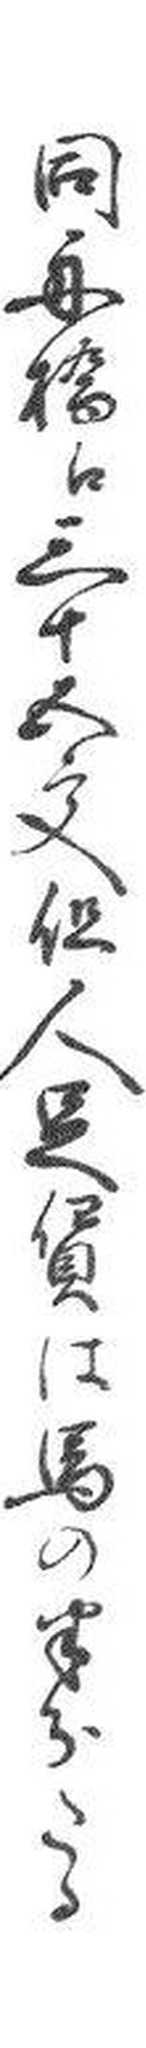同舟橋江三十五文但人足賃は馬の半分たる
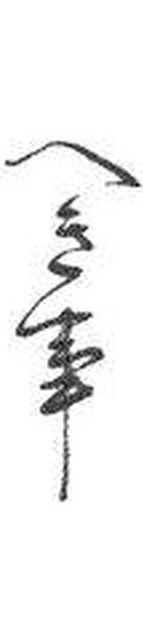へき事
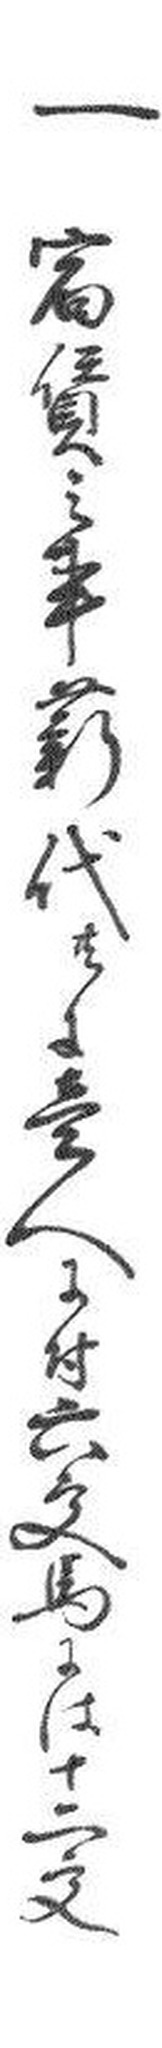一宿賃之事薪代共に壱人に付六文馬には十二文
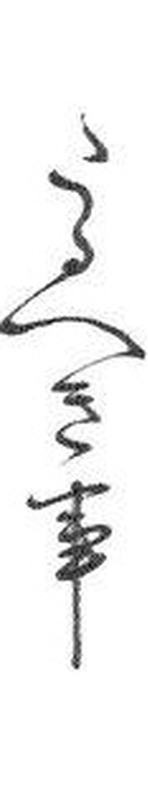たるへき事
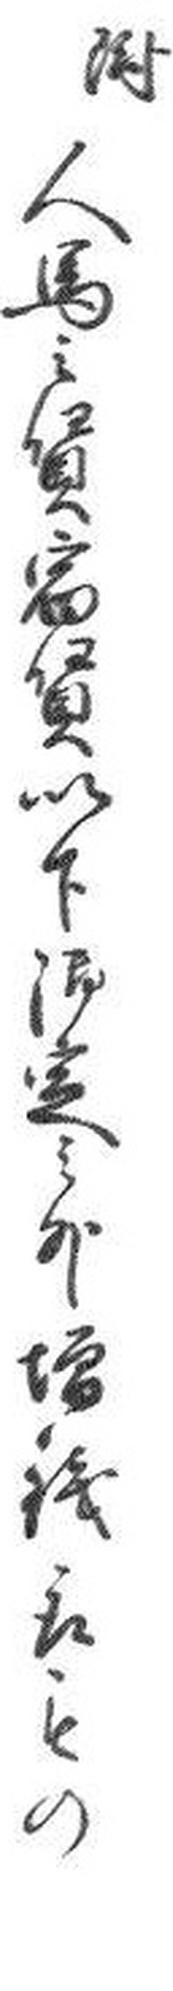附人馬之賃宿賃以下御定之外増銭取もの
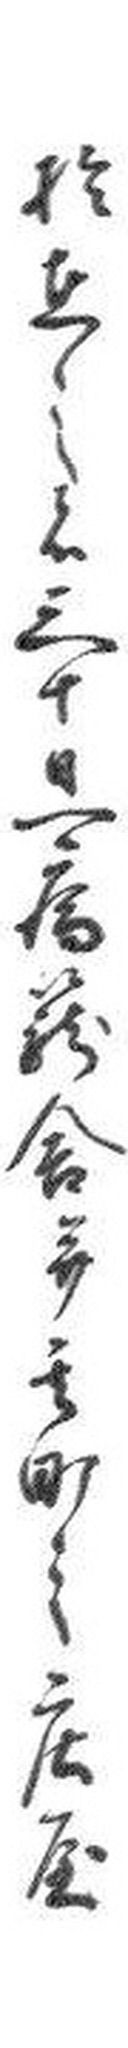於在之者三十日可為籠舎并其町之庄屋
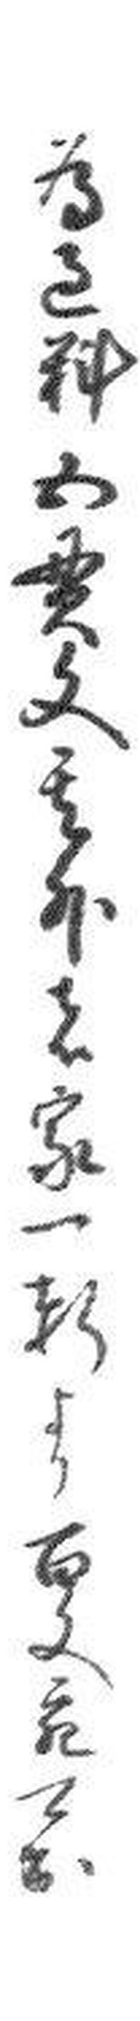為過料五貫文其外者家一軒より百文宛可出
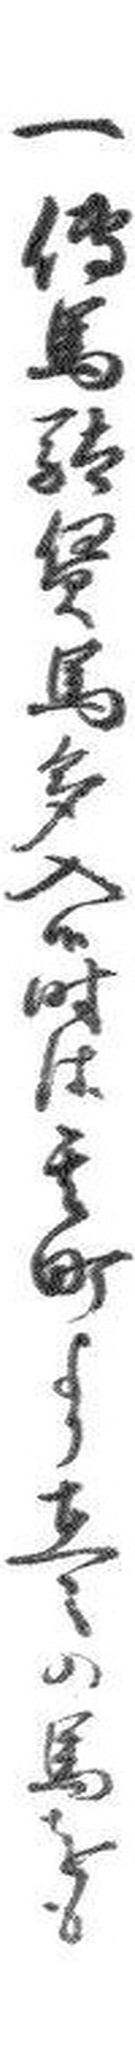一傳馬駄賃馬多入候時は其町より在々の馬をも
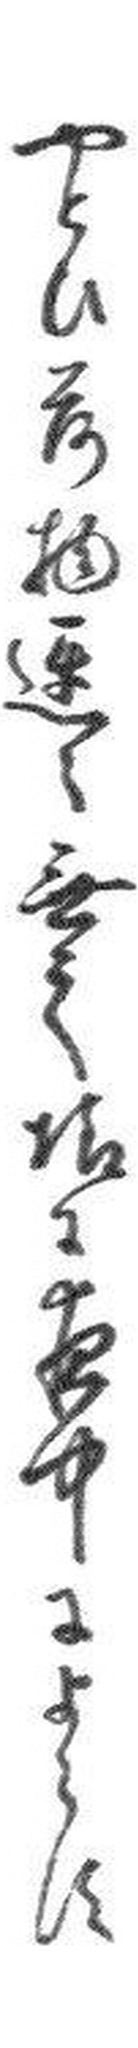やとひ荷物遅々無之様に夜中によらす
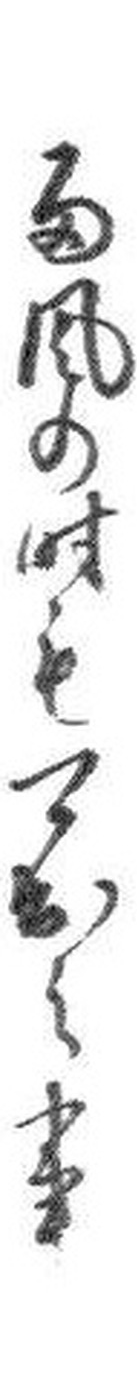雨風之時も可出之事
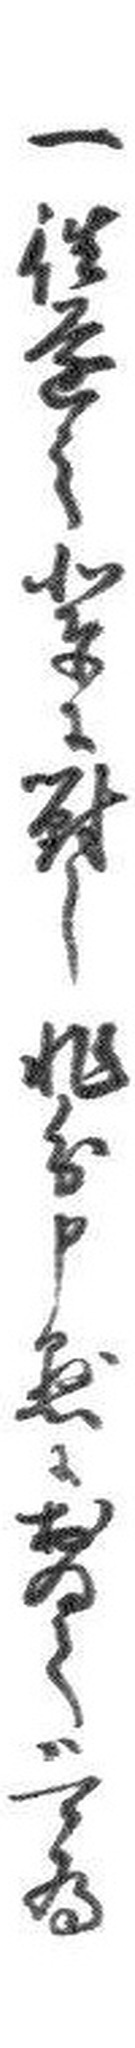一往還之輩に対し非分申懸におゐては可為
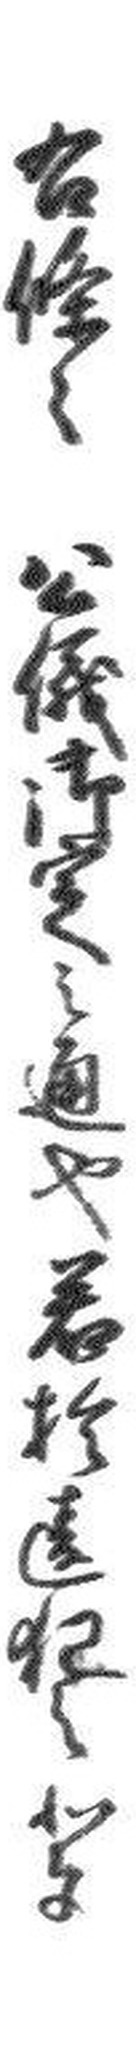右条々公儀御定之通也若於違犯之輩
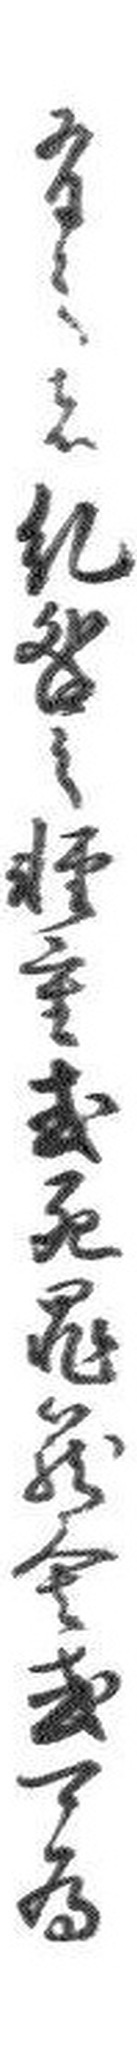有之者糺咎之軽重或死罪籠舎或可為
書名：家譜 六 光通公 従万治三年到寛文三年
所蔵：福井県文書館 Fukui Prefectural Archives
